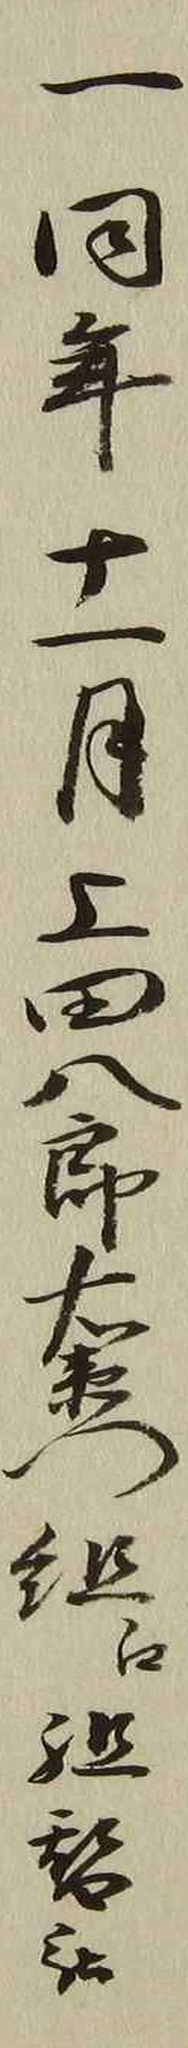一同年十一月上田八郎右衛門組江組替被
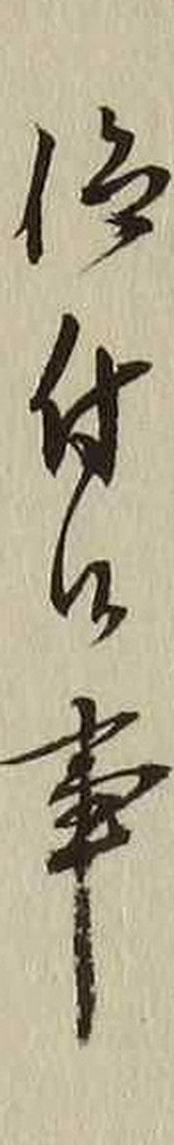仰付候事
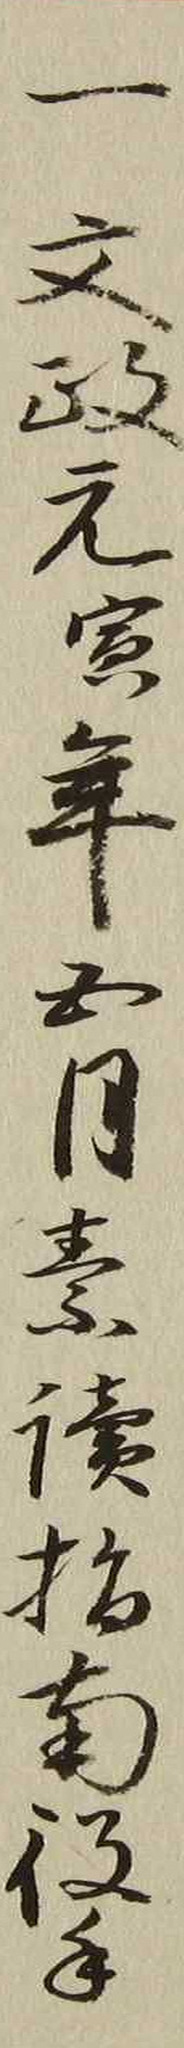一文政元寅年五月素読指南役手
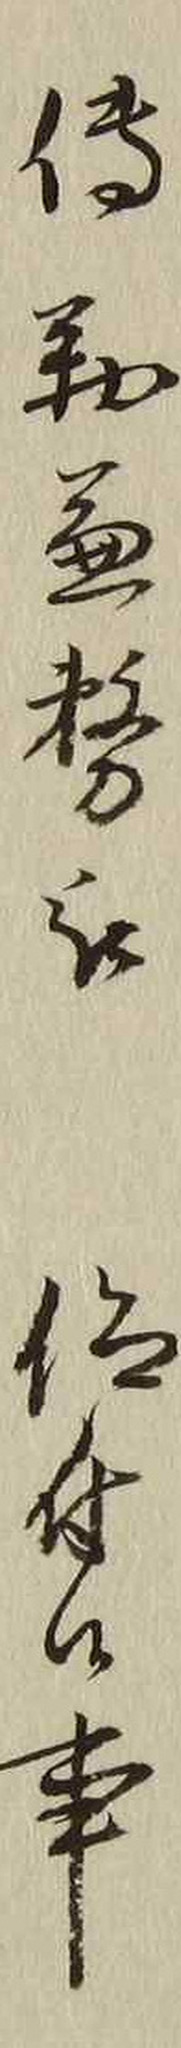伝勤兼務被仰付候事
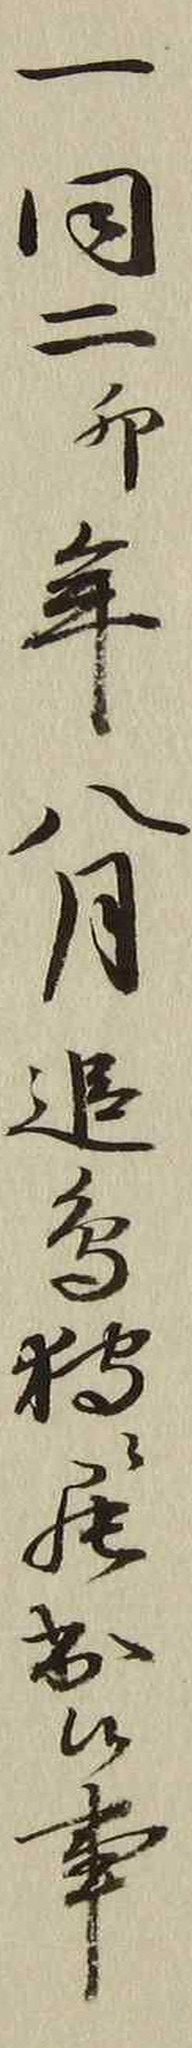一同二卯年八月追鳥狩ニ罷出候事
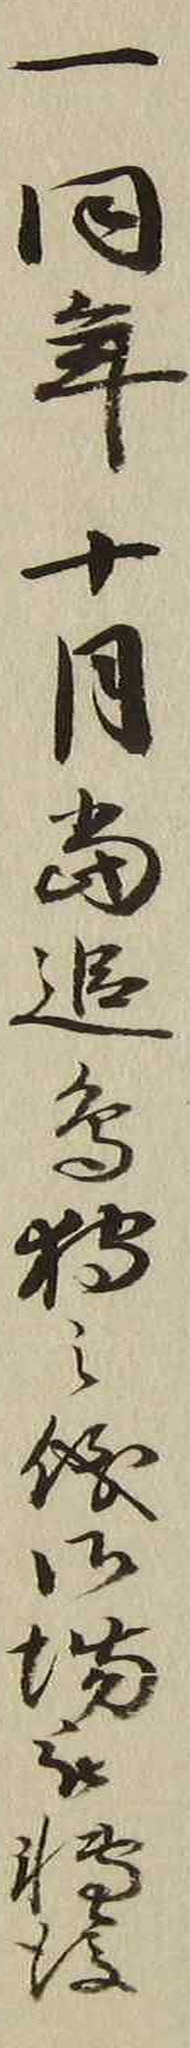一同年十月当追鳥狩之儀御場被転候後
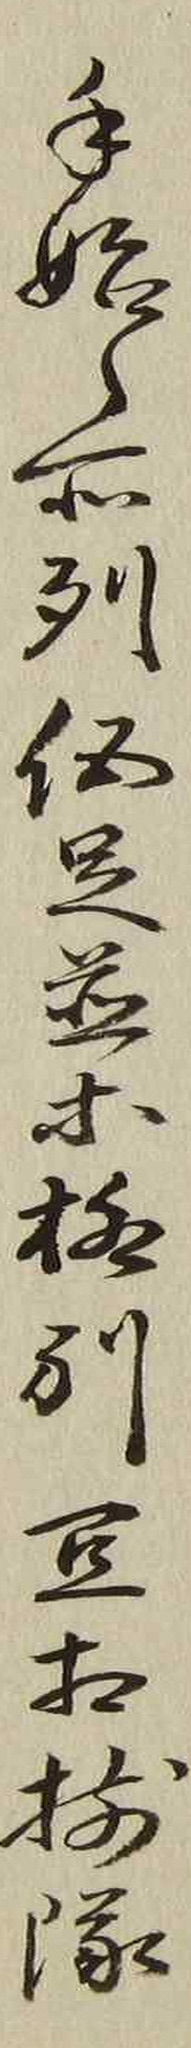手始候所列伍足並等格別宜相揃隊
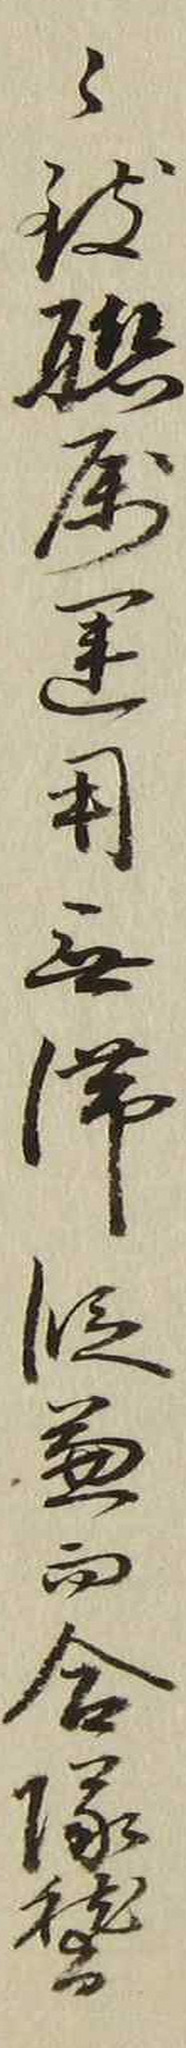々致聯属運用無滞段兼而合隊稽
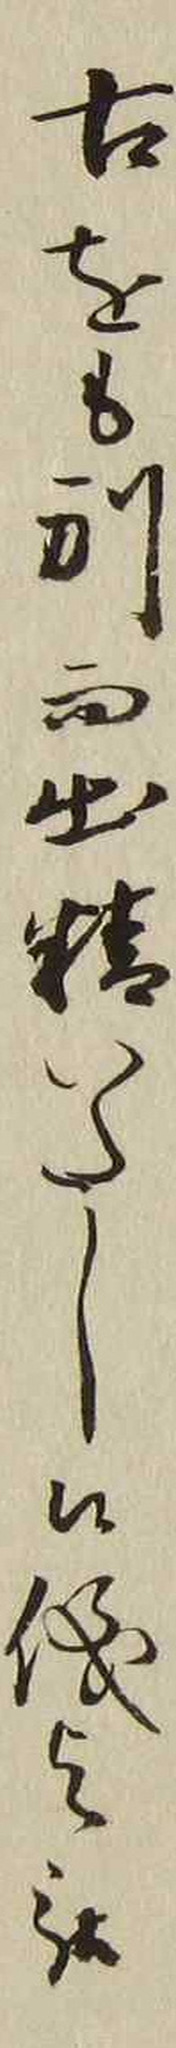古をも別而出精いたし候儀与被
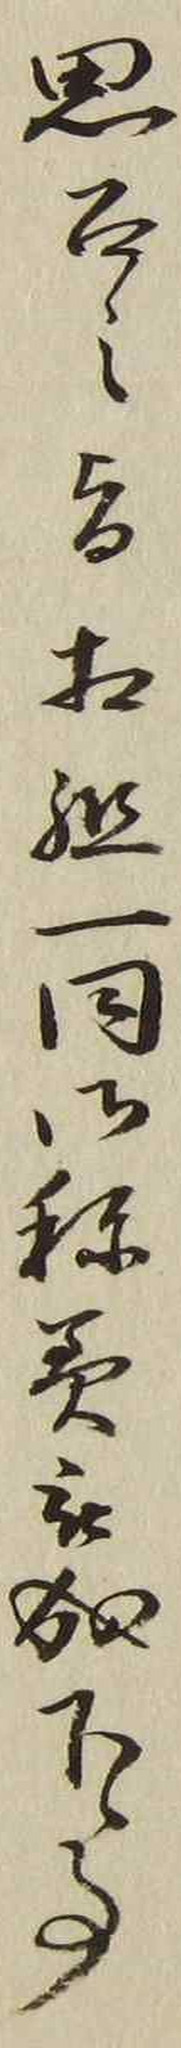思召之旨相組一同御称美被成下候事

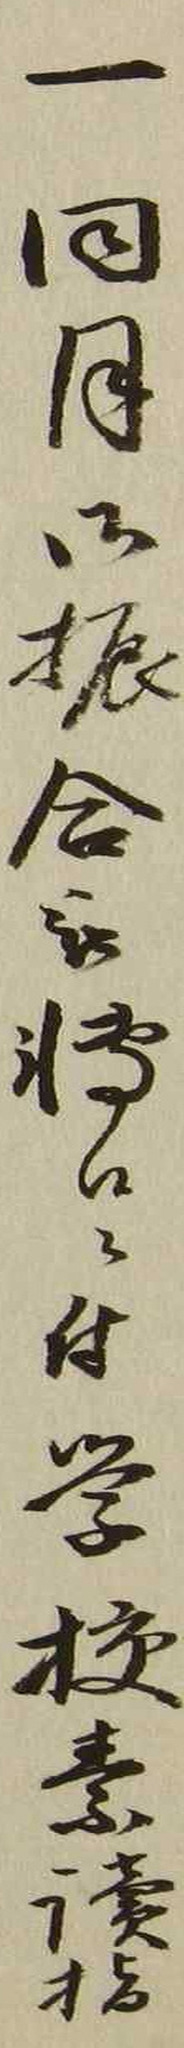一同月御振合被転候ニ付学校素読指
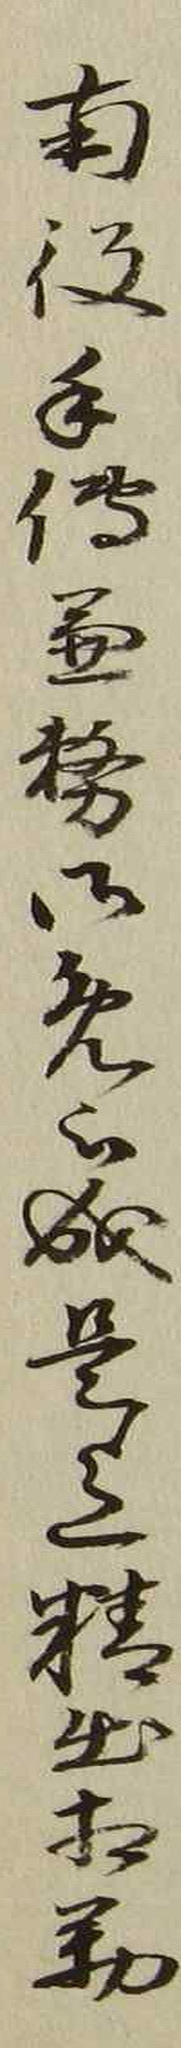南役手伝兼務御免被成是迄精出相勤
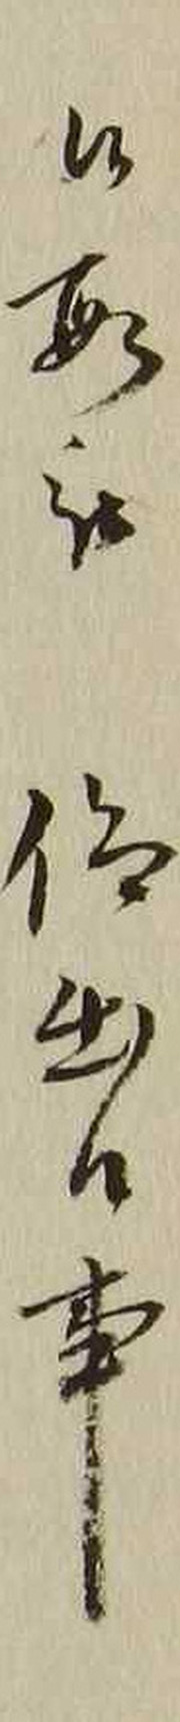候段被仰出候事
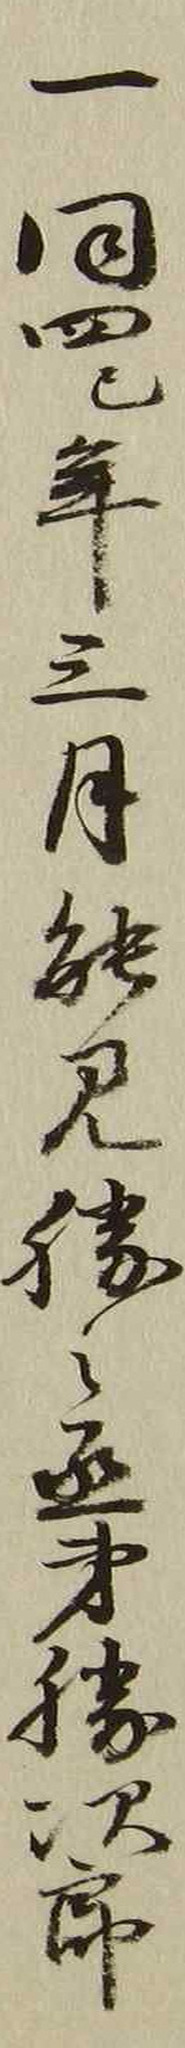一同四巳年三月能見勝之丞弟勝次郎
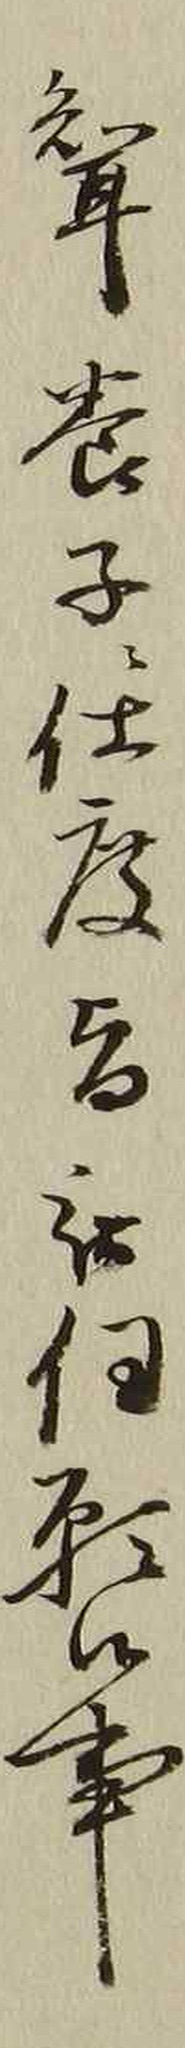婿養子ニ仕度旨被任願候事
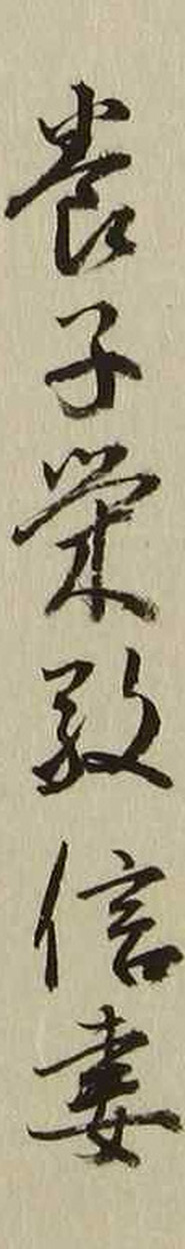女養子栄敬信妻
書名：諸士系譜　巻之61　と之部4
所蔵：会津若松市立会津図書館
